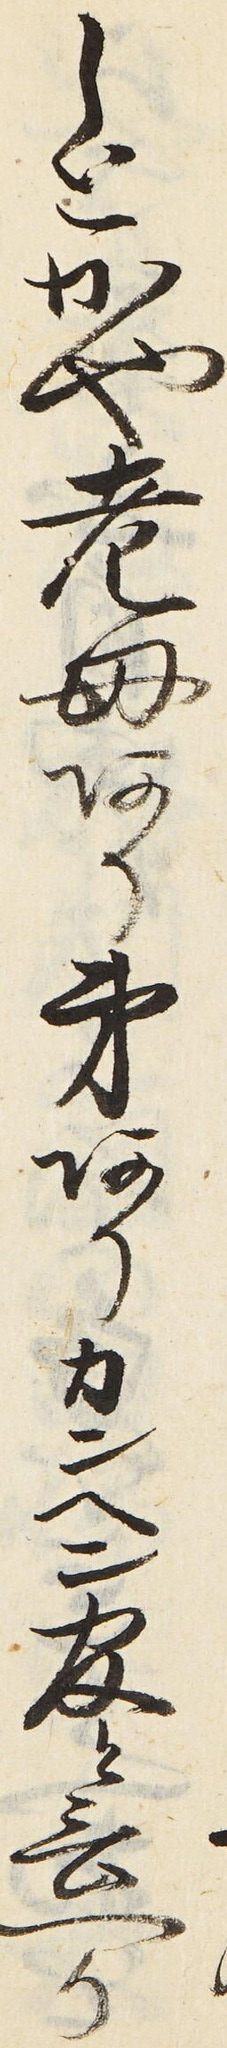しとかや老母あり弟ありカンヘン官と云へり
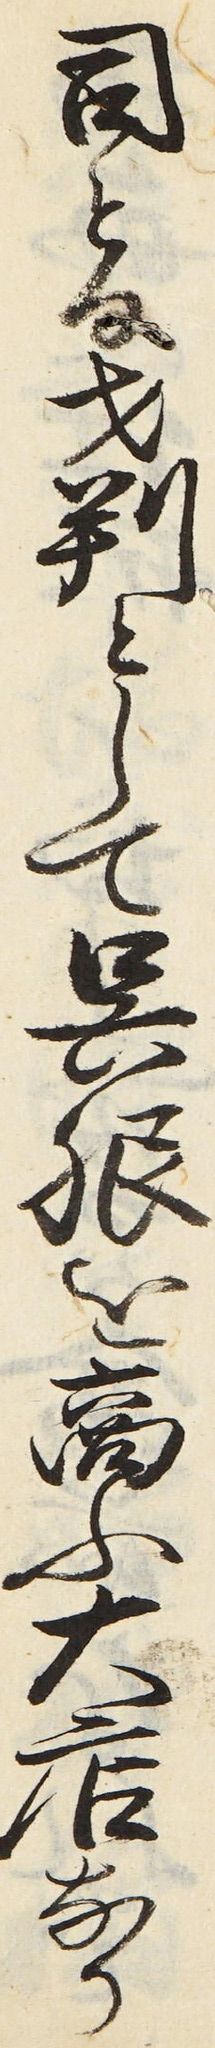司とる才判として呉服を商ふ大店なり
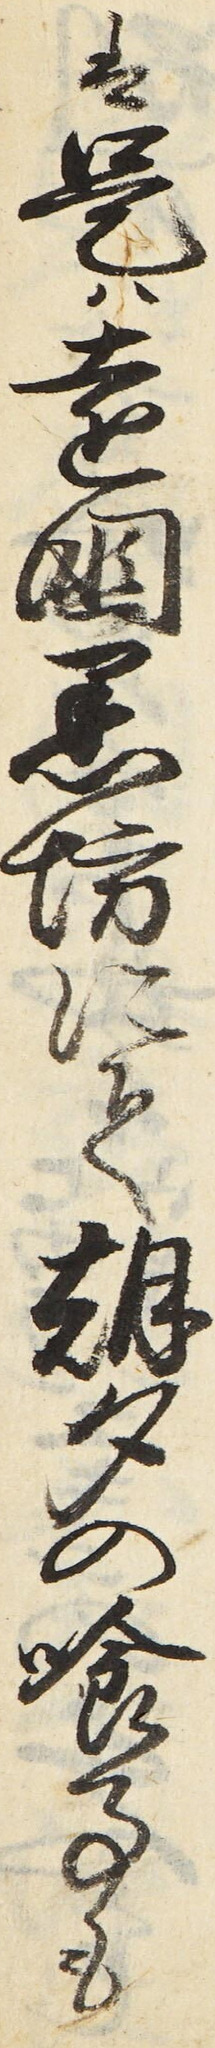は是は遠国黒坊にて朝夕の喰事も

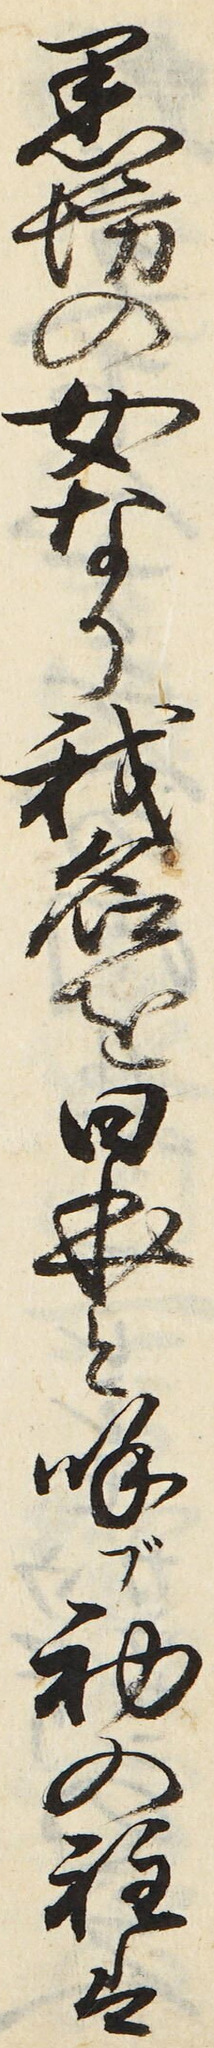黒坊の女なり我名を日本と呼ぶ初の程は
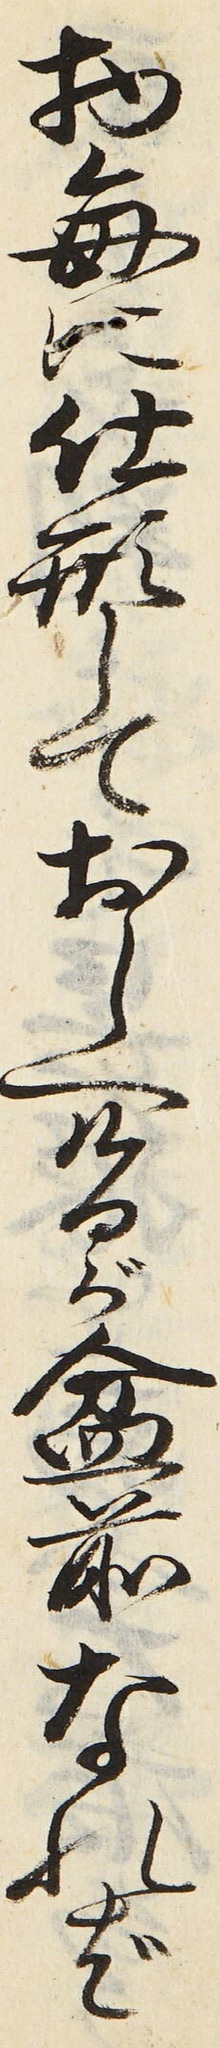物毎に仕形しておしへけるが盆前なれば
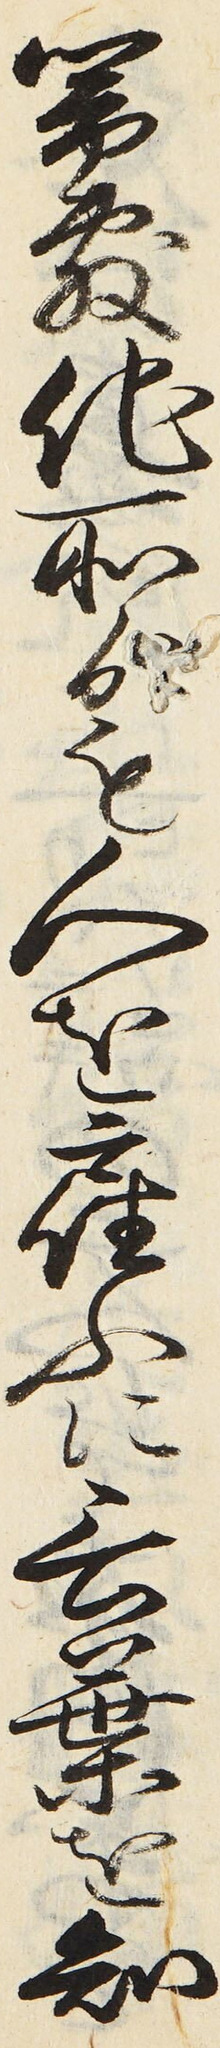閙敷他所ゟも人を雇ふに言葉を知
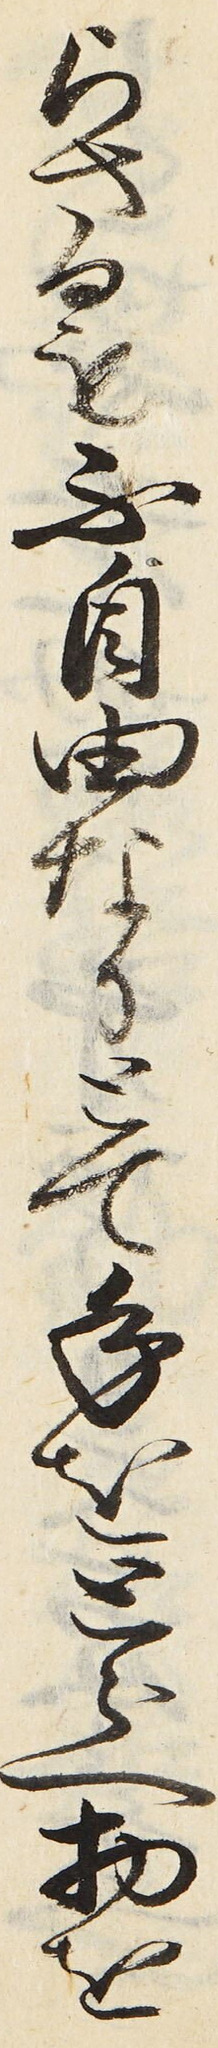らさるも不自由なりとて手をとらへ物を
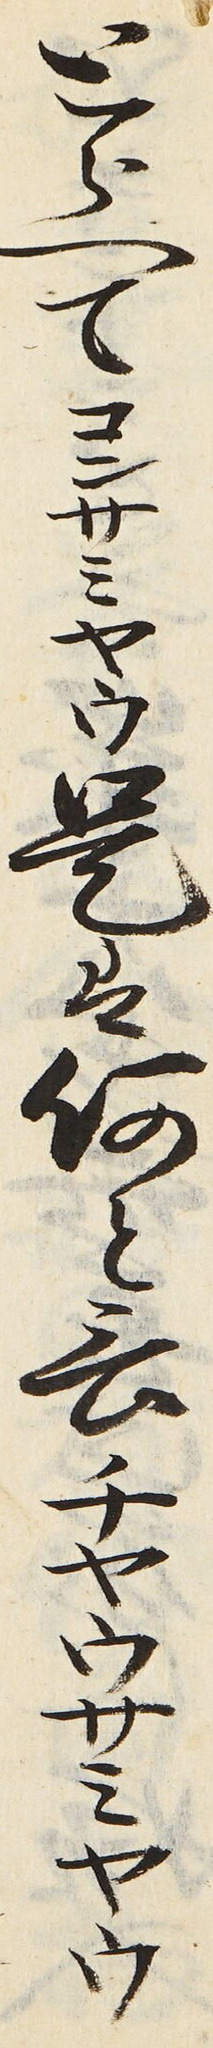とらへてコンサミヤウ是は何と云チヤウサミヤウ
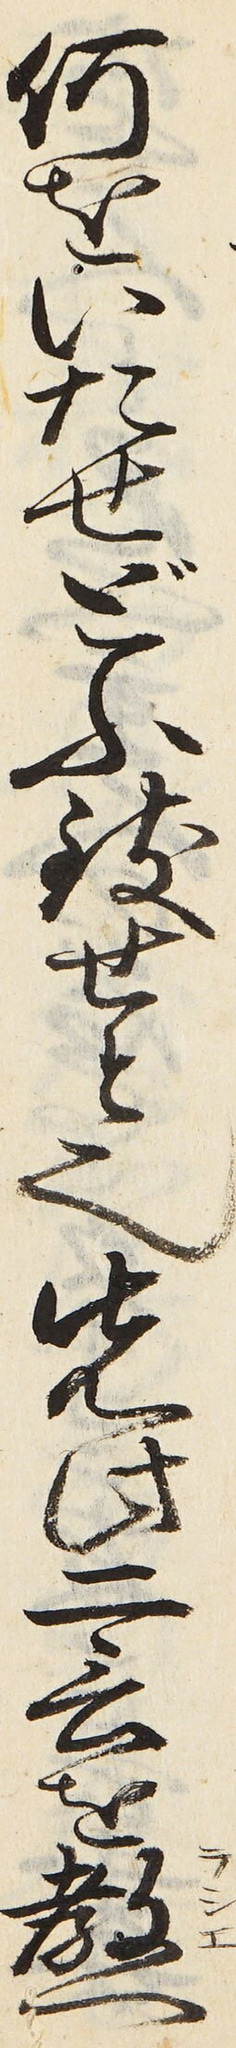何をいたせどふ致せと也先此二言を教へ
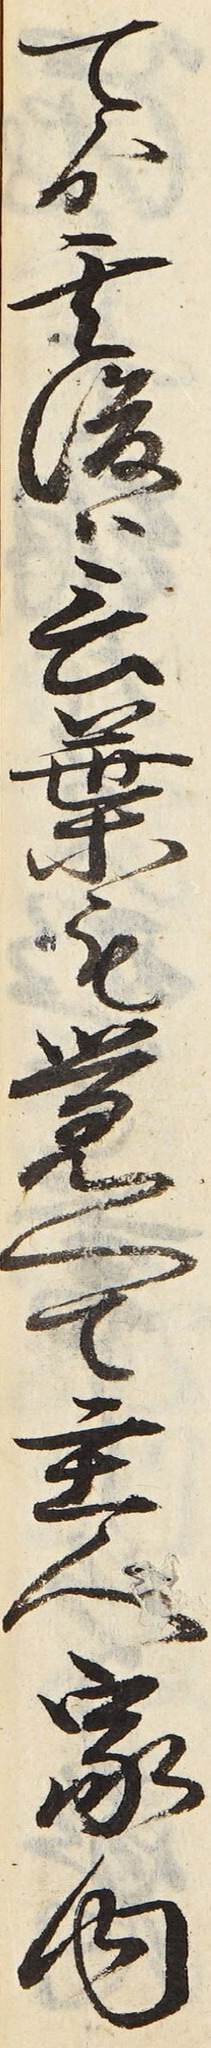てゟ其後は言葉も覚へて主人家内
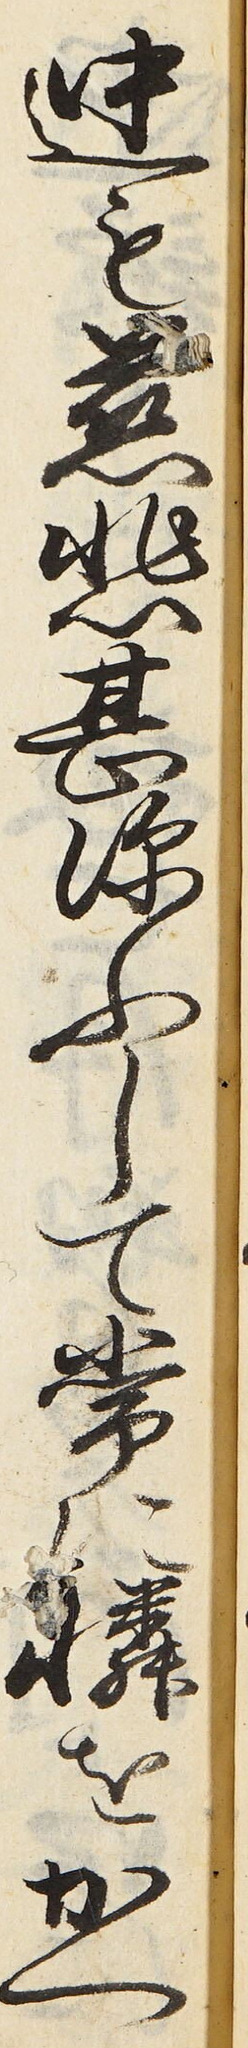迚も慈悲甚深ふして常に憐をかへ
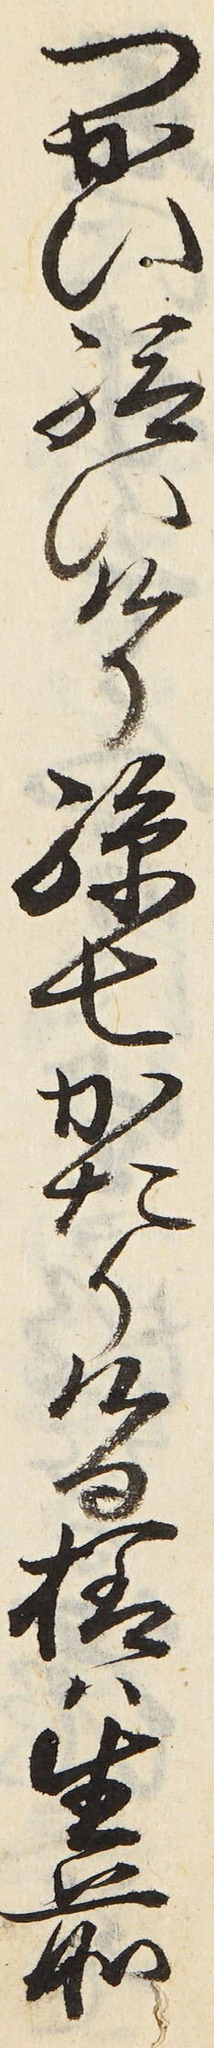つかひ給ひけり孫七かたりける様は生前
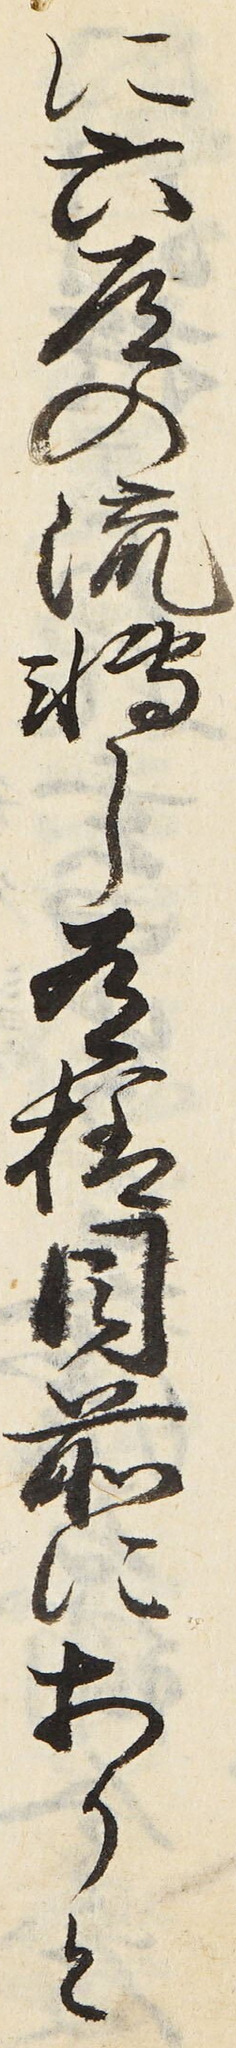に六道の流転し有様目前にありと
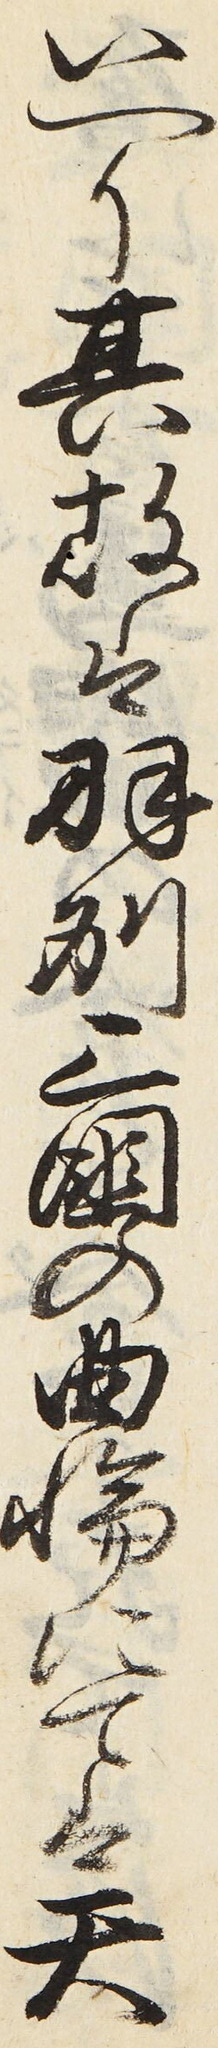いへり其故は羽州三国の曲輪にては天
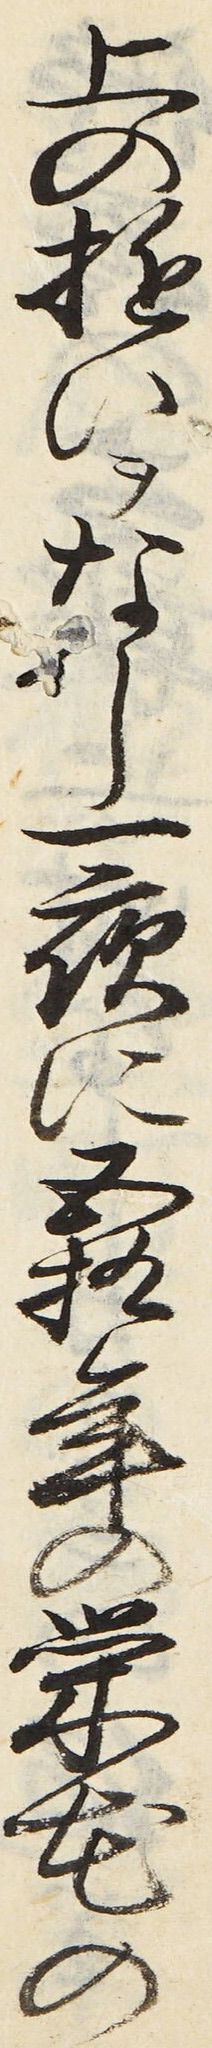上の遊ひヲなし一夜に五拾年の栄花の
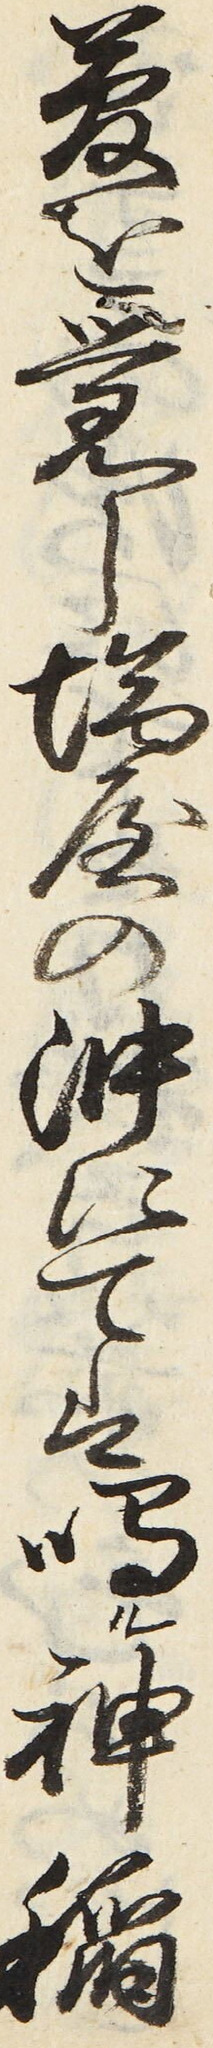夢を覚し塩屋の沖にては鳴る神稲
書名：華夷九年録
